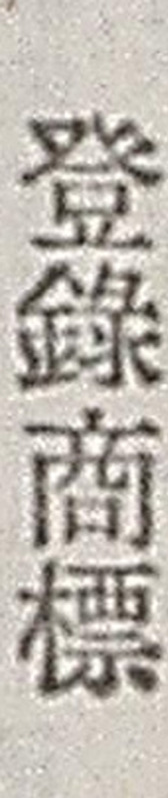登録商標
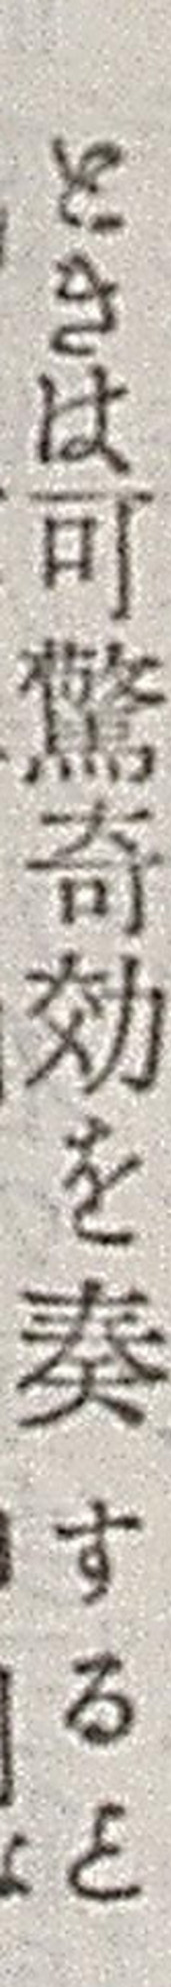ときは可驚奇効を奏すること
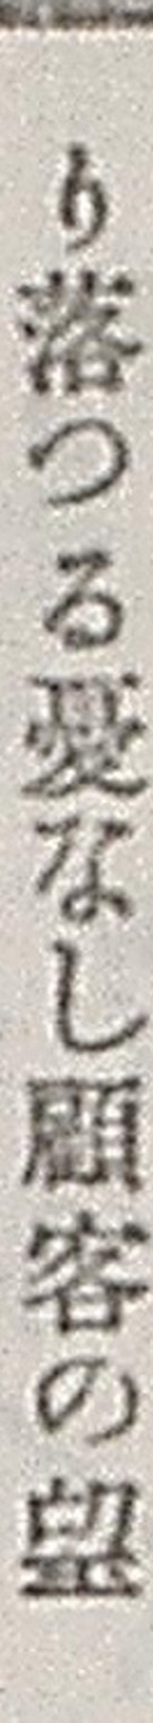り落つる憂なし顧客の望
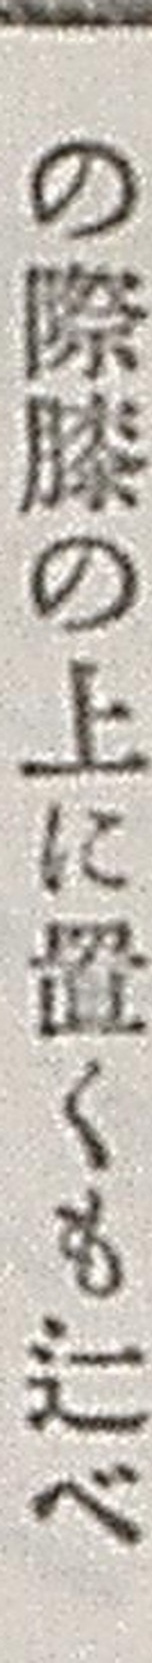の際膝の上に置くも辷べ
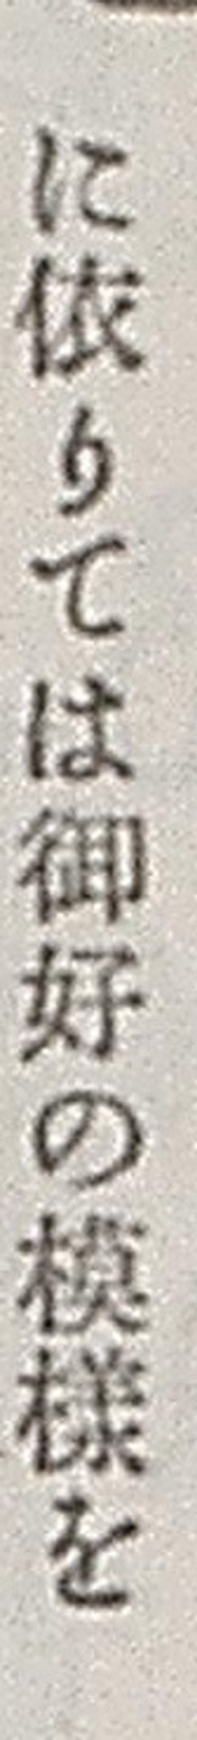に依りては御好の模様を
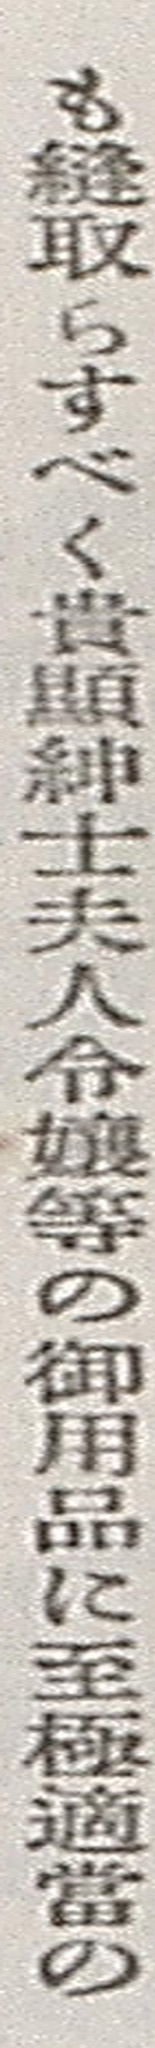も縫取らすべく貴顕紳士夫人令嬢等の御用品に至極適当の
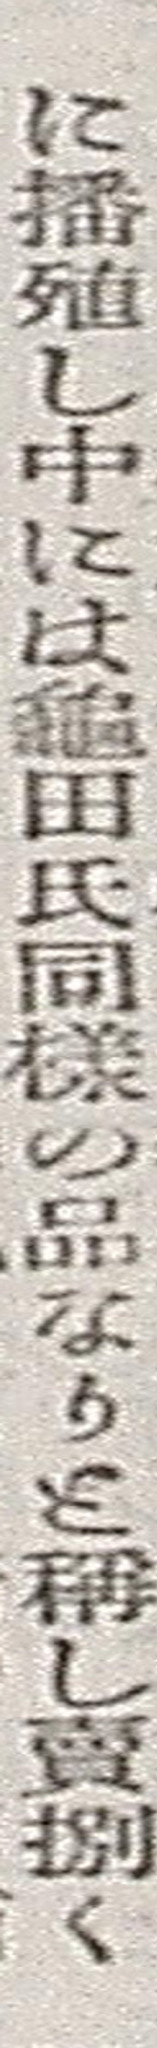に播殖し中には亀田氏同様の品なりと称し売捌く
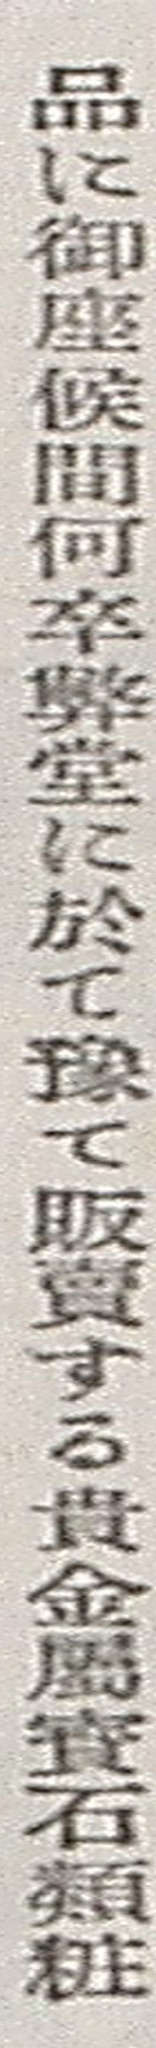品に御座候間何卒弊堂に於て予て販売する貴金属宝石類粧
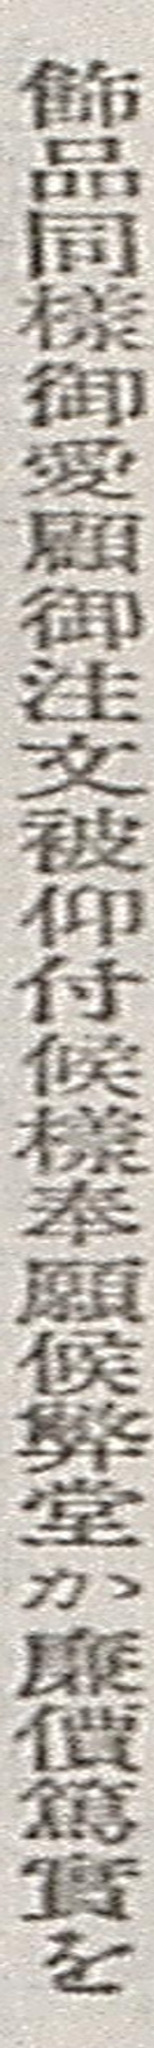飾品同様御愛顧御注文被仰付候様奉願候弊堂か廉価篤実を
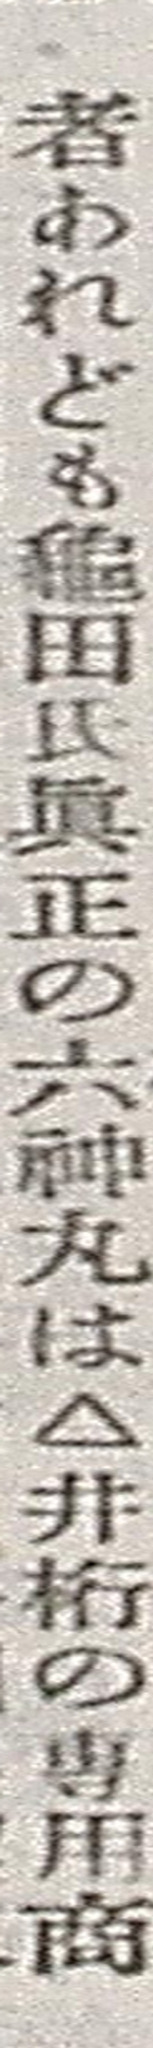者あれども亀田氏真正の六神丸は△井桁の専用商
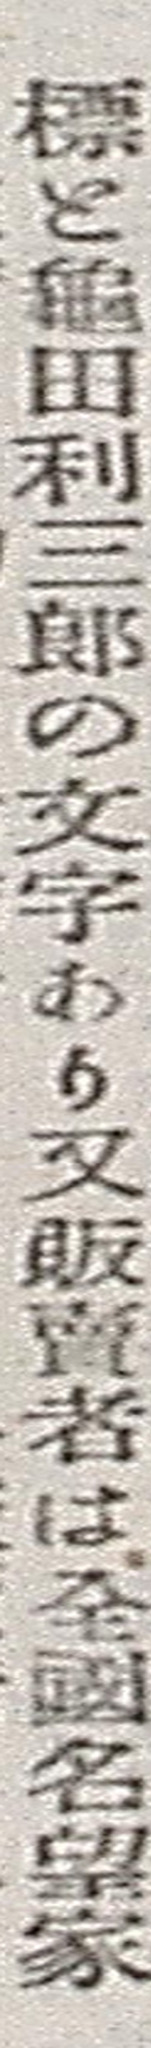標と亀田利三郎の文字あり又販売者は全国名望家
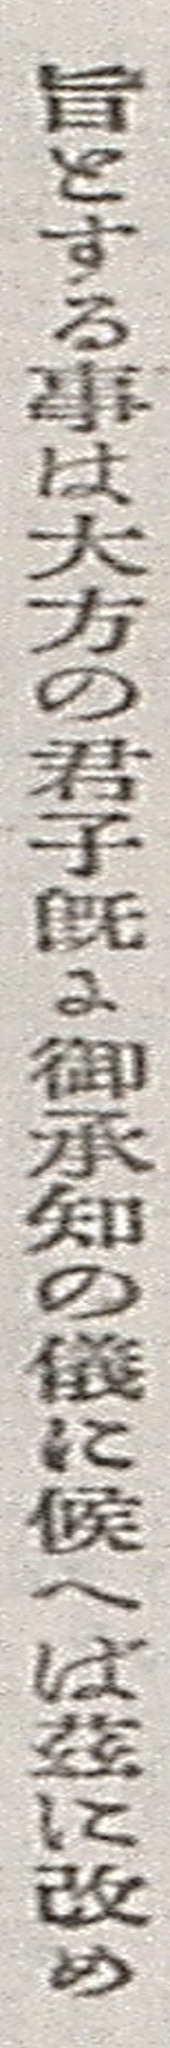旨とする事は大方の君子既に御承知の儀に候へば茲に改め
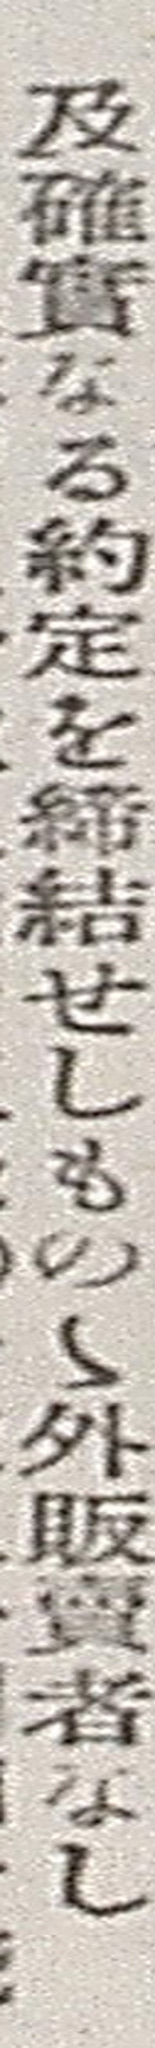及確実なる約定を締結せしものゝ外販売者なし
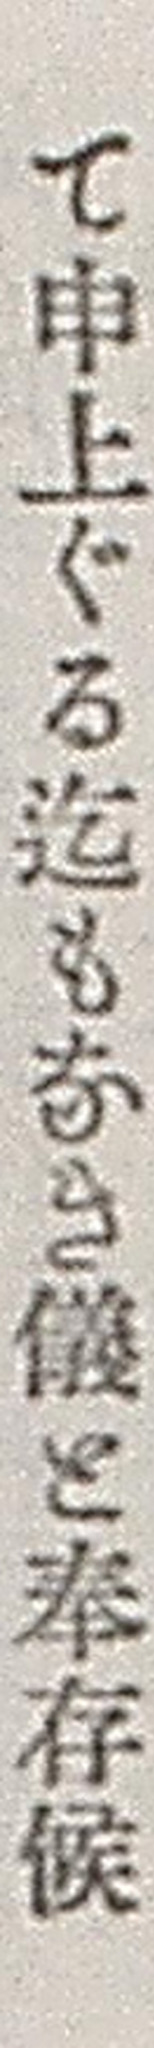て申上ぐる迄もなき儀と奉存候
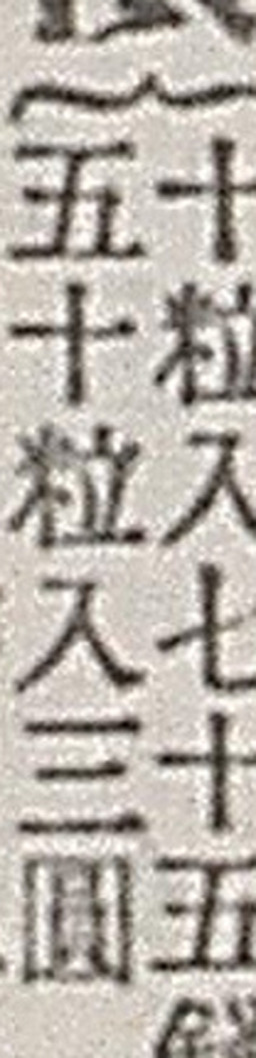五十粒入三円
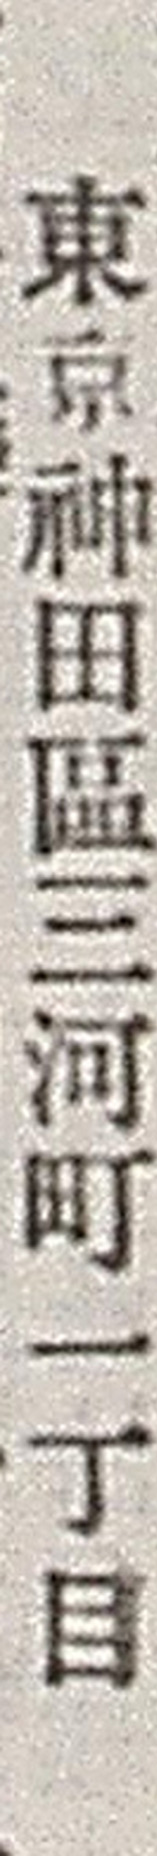東京神田区三河町一丁目
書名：風俗畫報臨時増刊第百二十號　大海嘯被害録（下）
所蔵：東京大学地震研究所図書室 Earthquake Research Institute Library, The University of Tokyo, JAPAN
